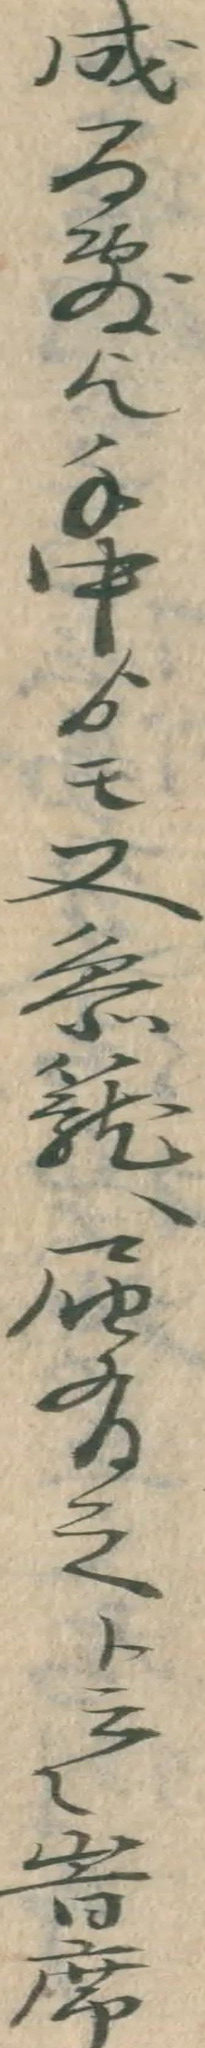成間敷歟手中ゟモ又参籠へ届有之ト云々旹席
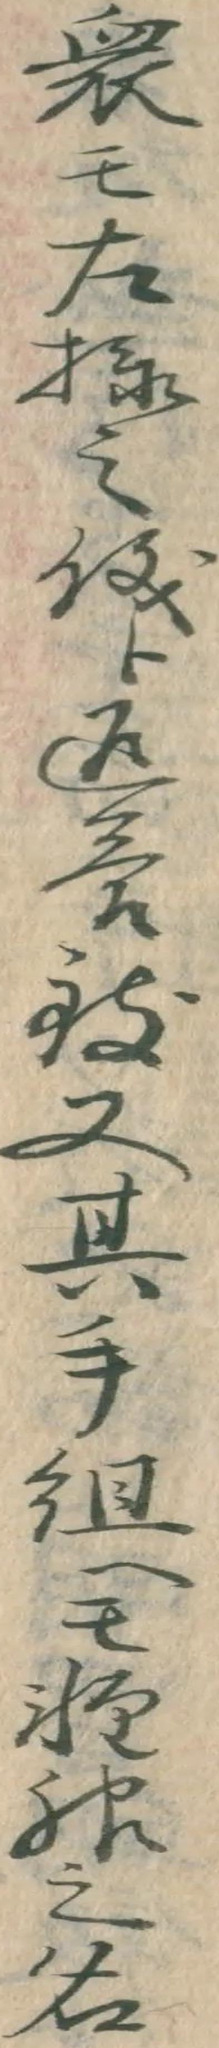衆モ左様之儀ト返答致又其手組へモ軽服之名
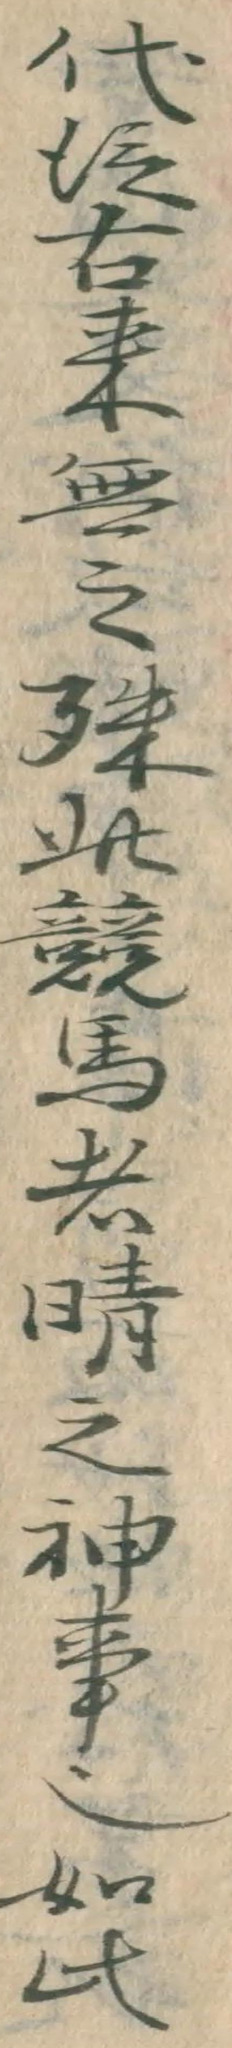代従古来無之殊此競馬者晴之神事也如此
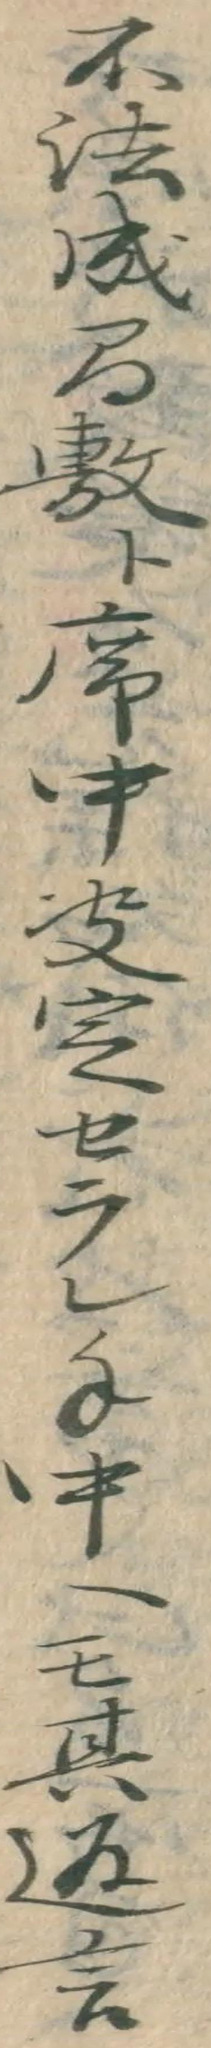不法成間敷ト席中決定セラレ手中ヘモ其返言
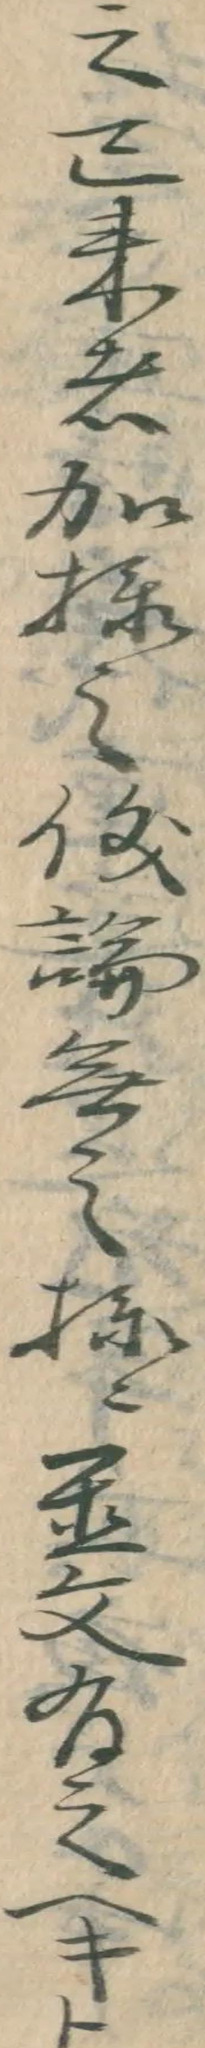之已来者加様之儀論無之様ニ置文有之へキト

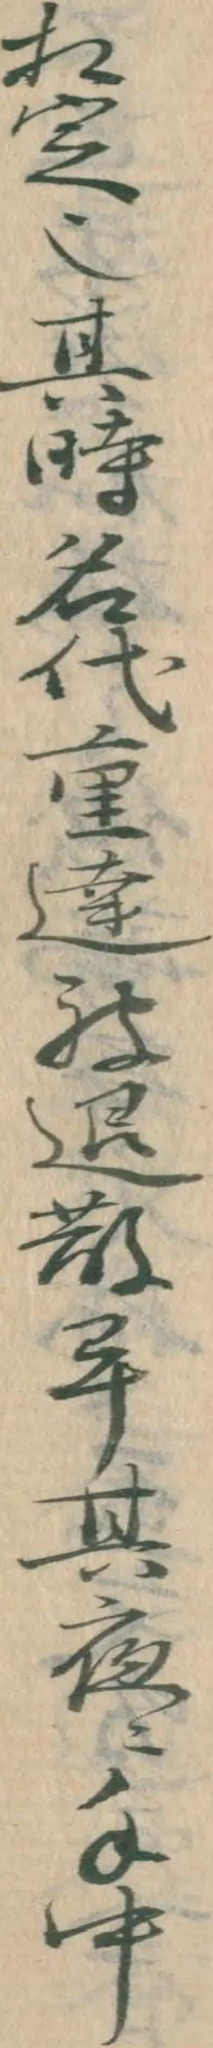相定也其時名代重達被退散畢其夜ニ手中
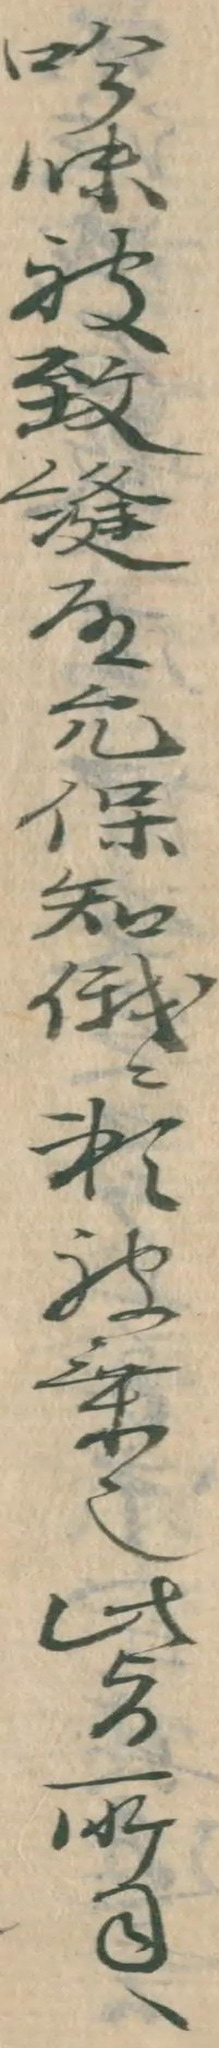吟味被致縫殿允保知俄二頼被乗也此旨所司ヘ
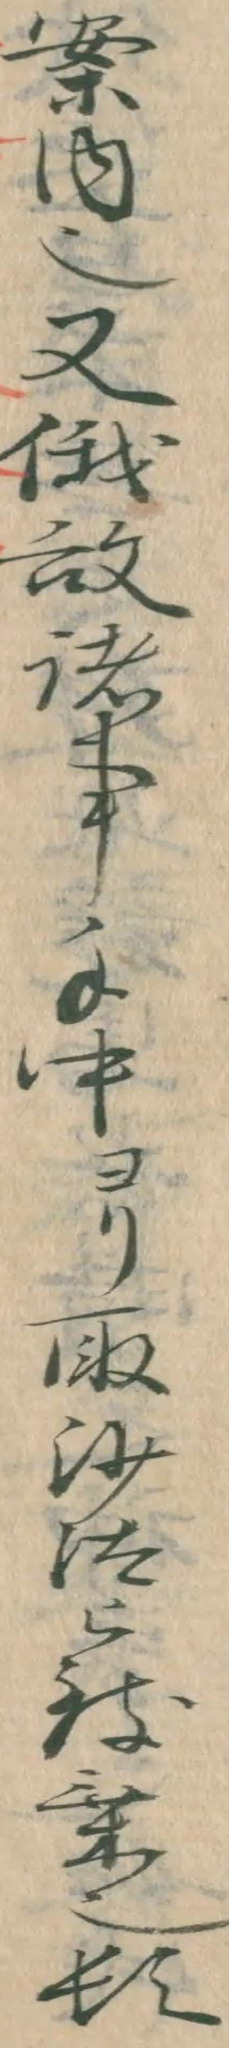案内也又俄故諸事手中ヨリ取沙汰被致乗也頓
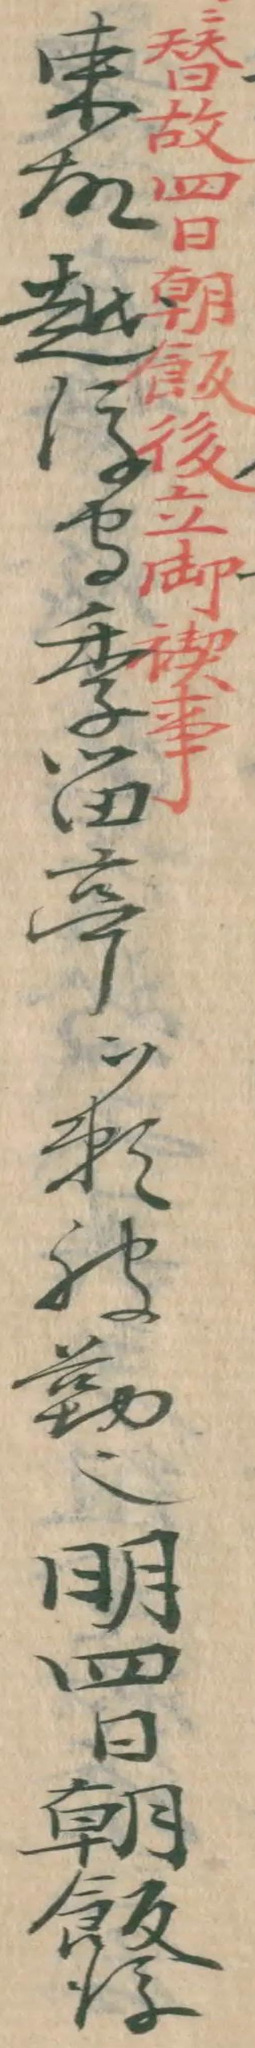束故越後守季留亭ヲ頼被勤也明四日朝飯後
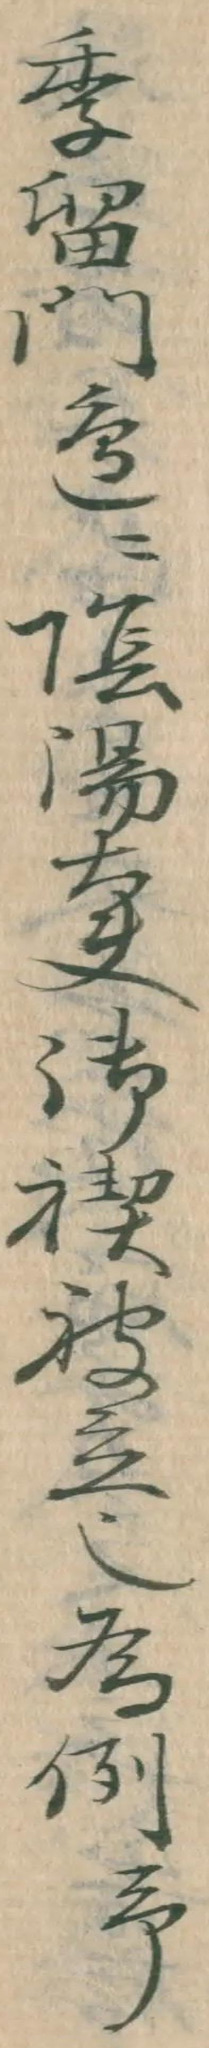季留門辺二陰陽大夫御禊被立也為例予
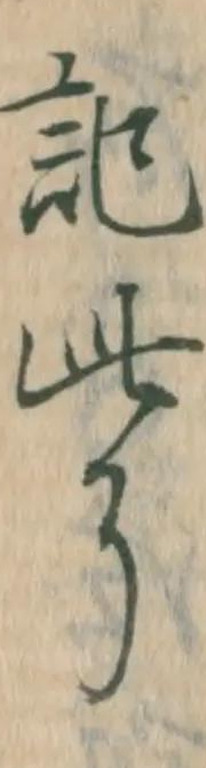記此了
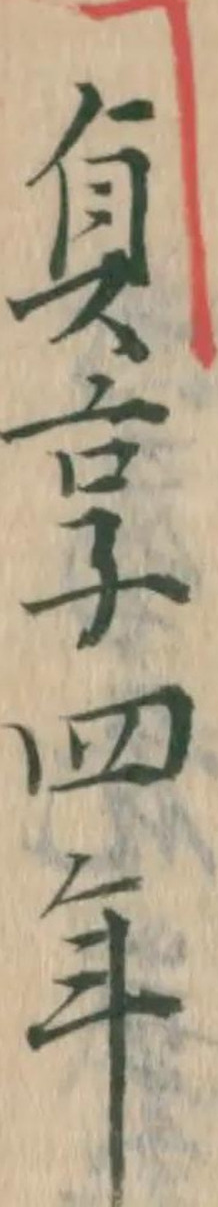貞享四年
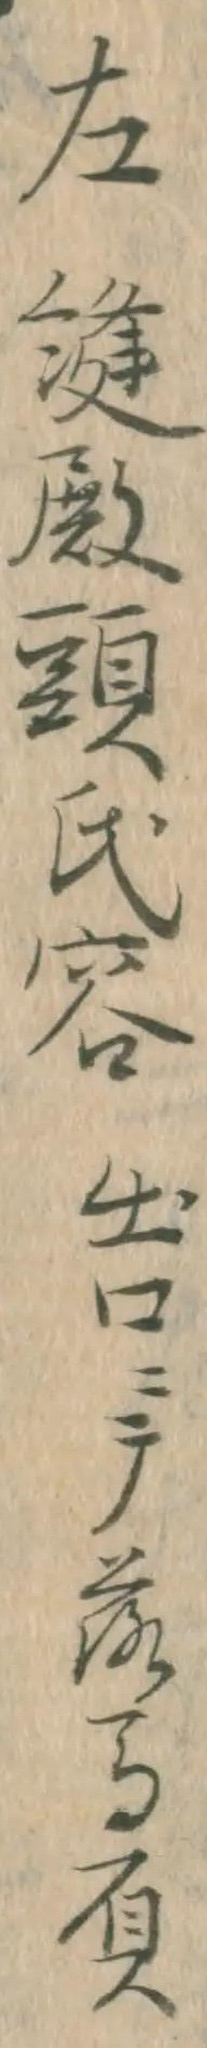左縫殿頭氏容出口ニテ落馬負
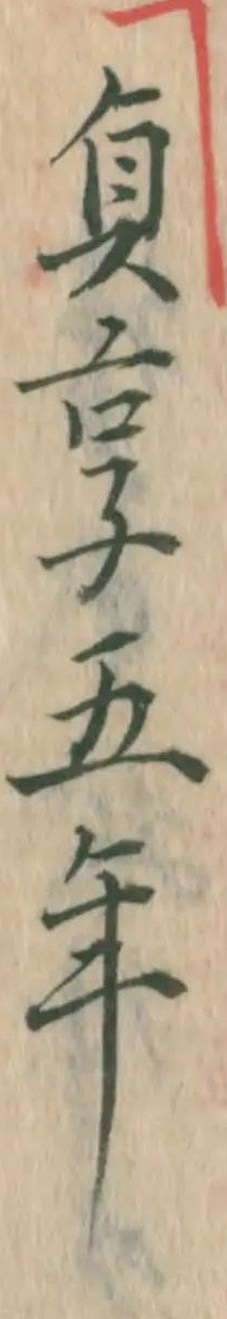貞享四年
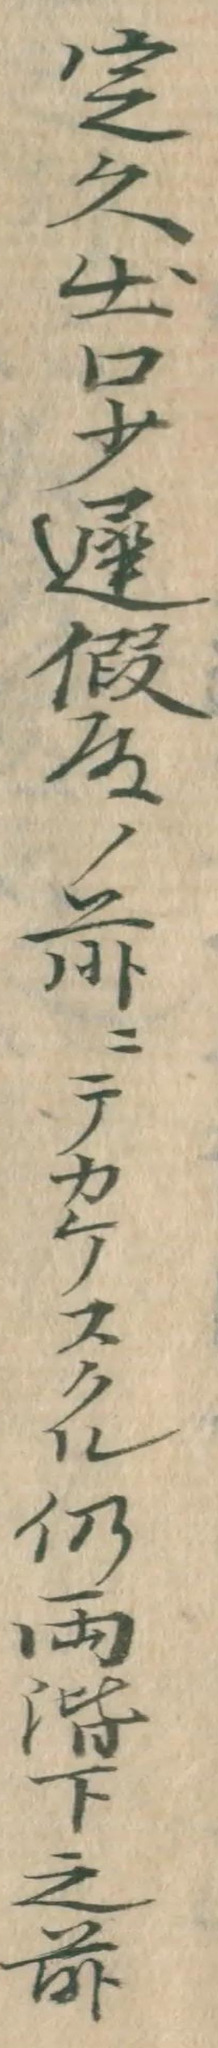定久出口少遅仮殿ノ前ニテカケスクル仍両階下之前
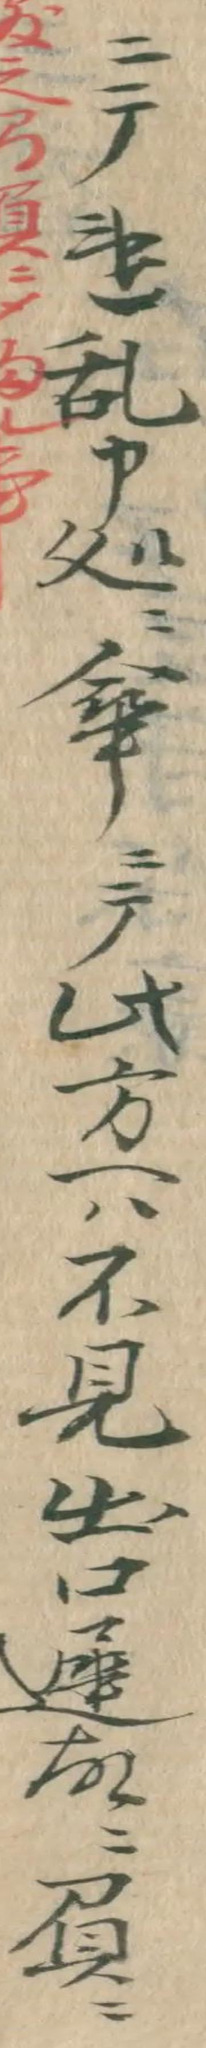ニテ遅乱申処ニ傘ニテ此方へハ不見出口遅故ニ負ニ
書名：賀茂社記録. 第10冊
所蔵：国立国会図書館 National Diet Library, JAPAN
